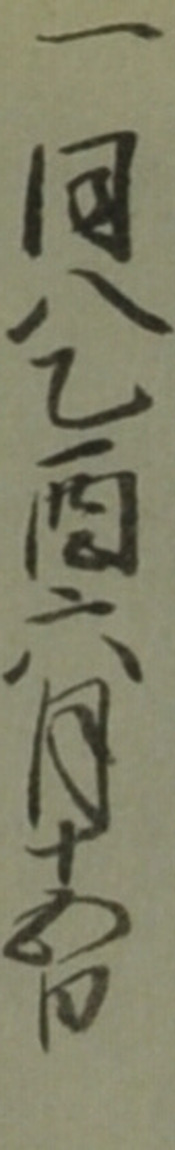一同八乙酉六月十五日
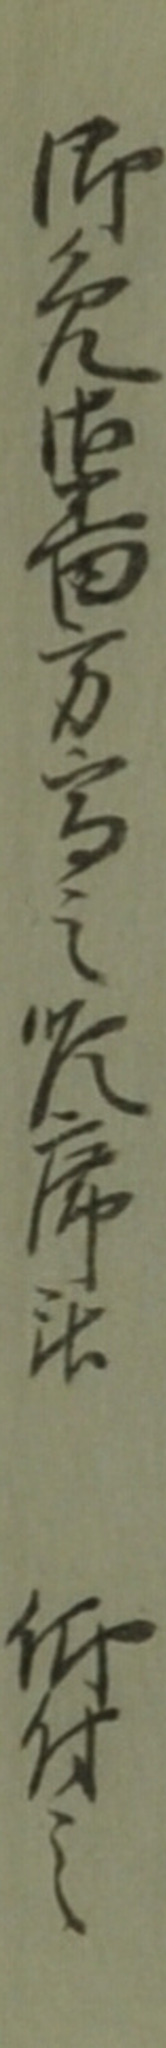御免御番方之順席被仰付之
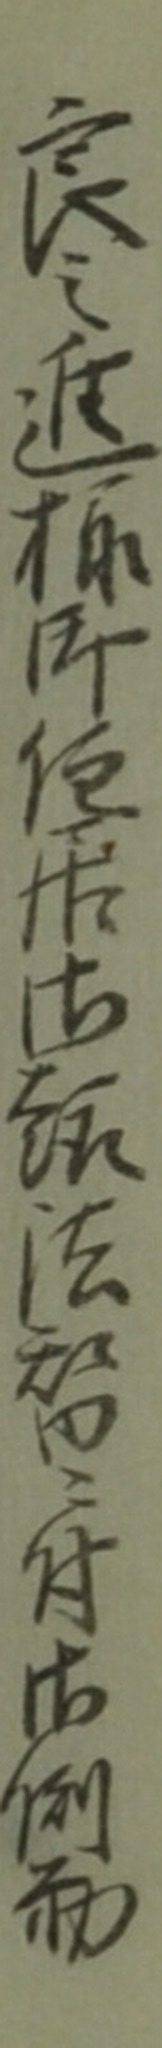良之進様町住居御趣法替ニ付御側勤
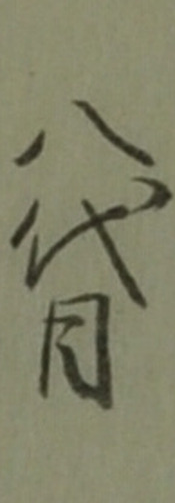八代目
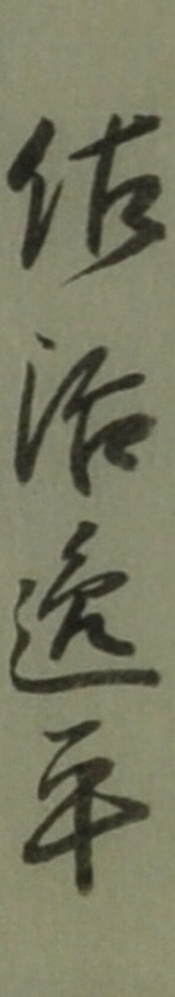佐治逸平
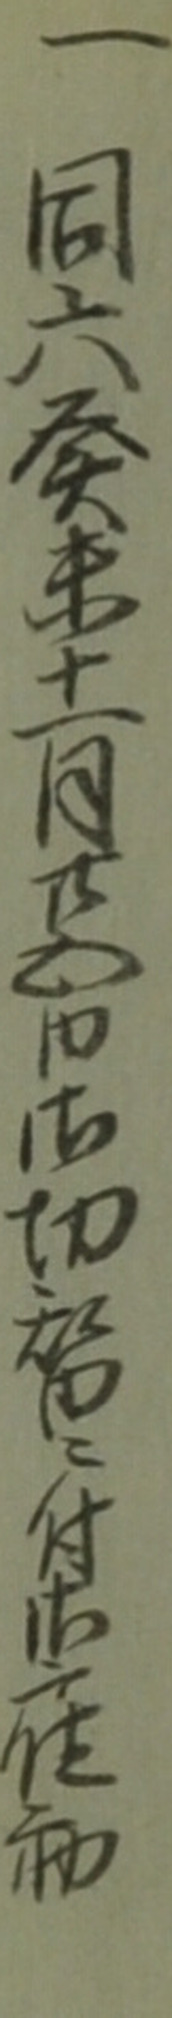一同六癸未十一月廿五日御切替ニ付御雇勤
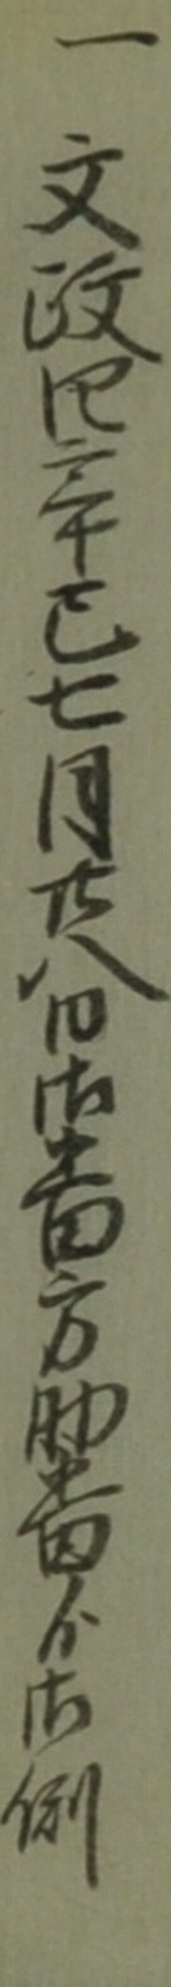一文政四辛巳七月廿八日御番方助番ゟ御側
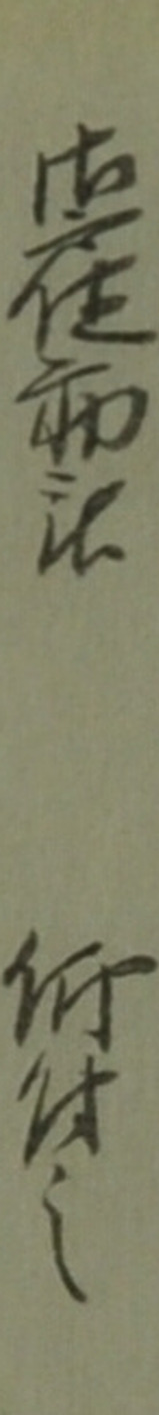御雇勤被仰付之
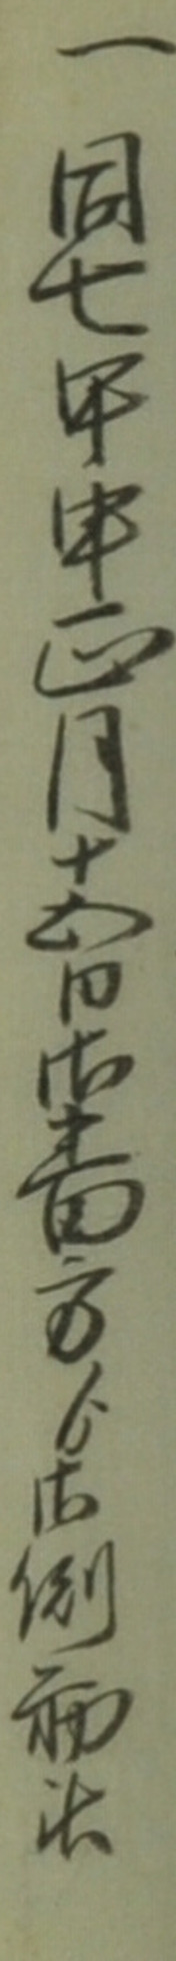一同七甲申正月十五日御番方ゟ御側勤被
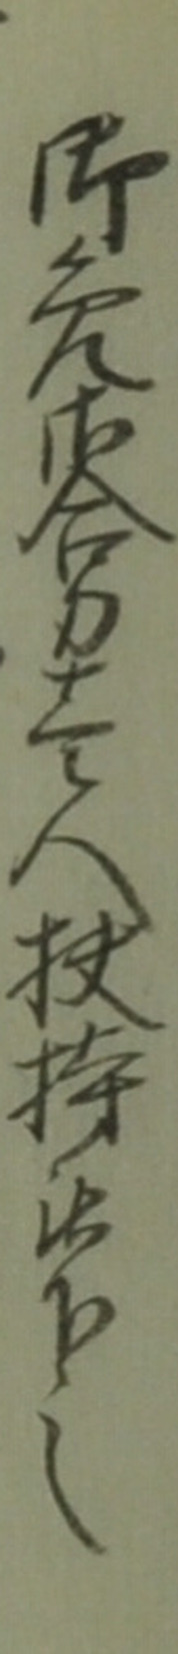御免御合力壱人扶持被下之

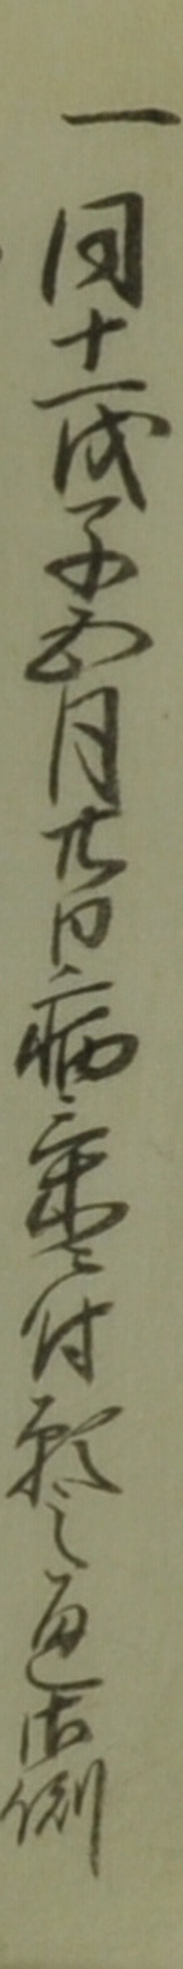一同十一戊子五月廿日病気ニ付願之通御側
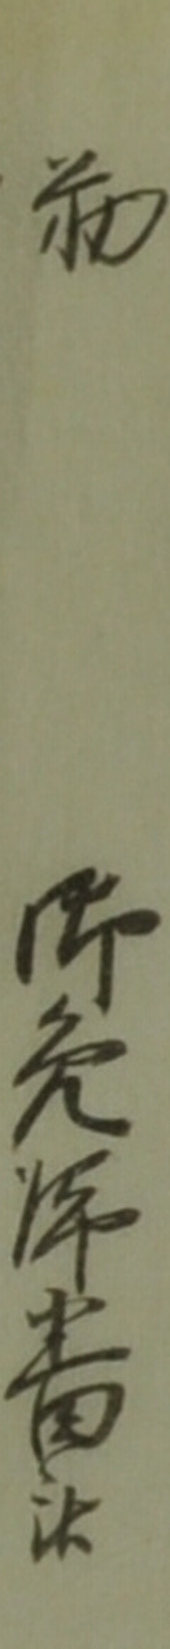勤御免帰番被
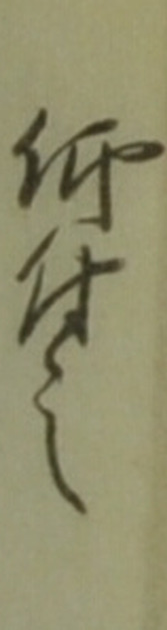仰付之
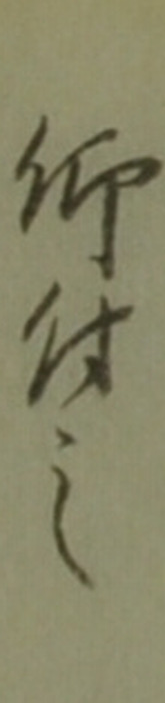仰付之
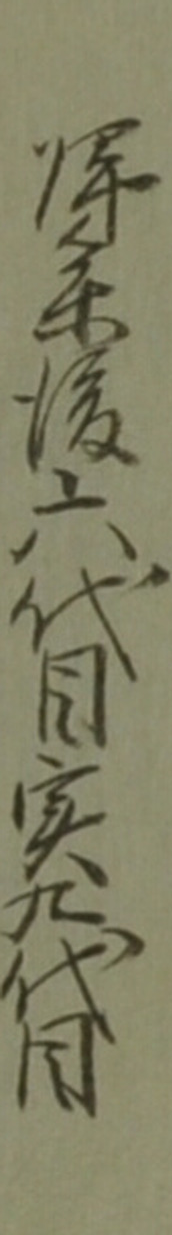帰参後六代目実九代目
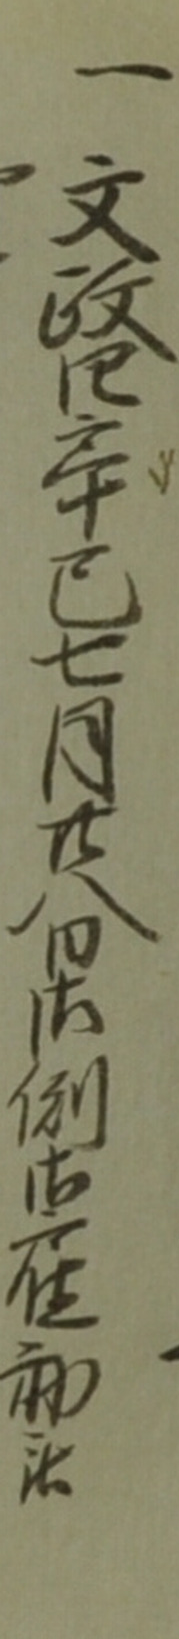一文政四辛巳七月廿八日御側御雇
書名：諸御役代々録（五）
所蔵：伊那市立高遠町図書館・合同会社AMANE
